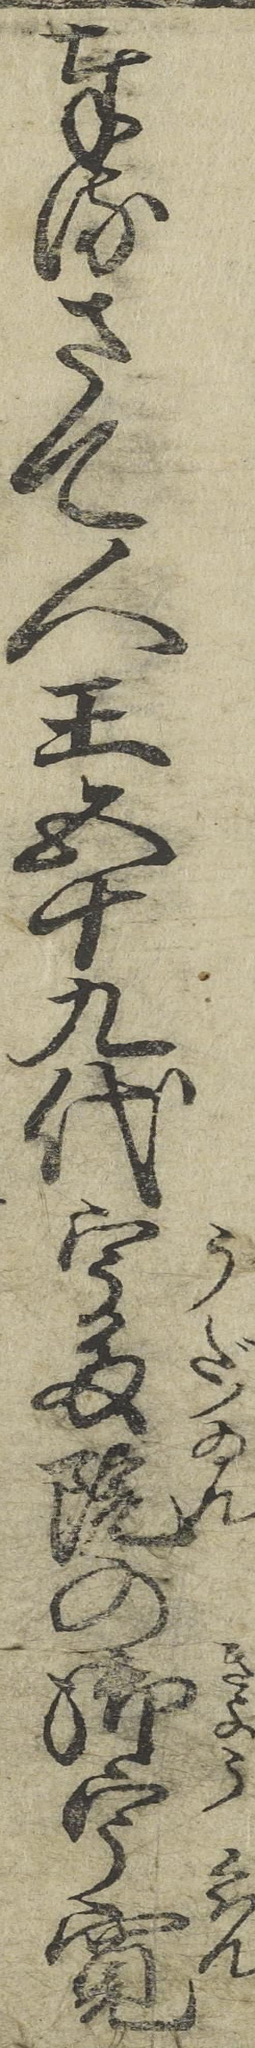奉るさて人王五十九代宇多院の御宇寛
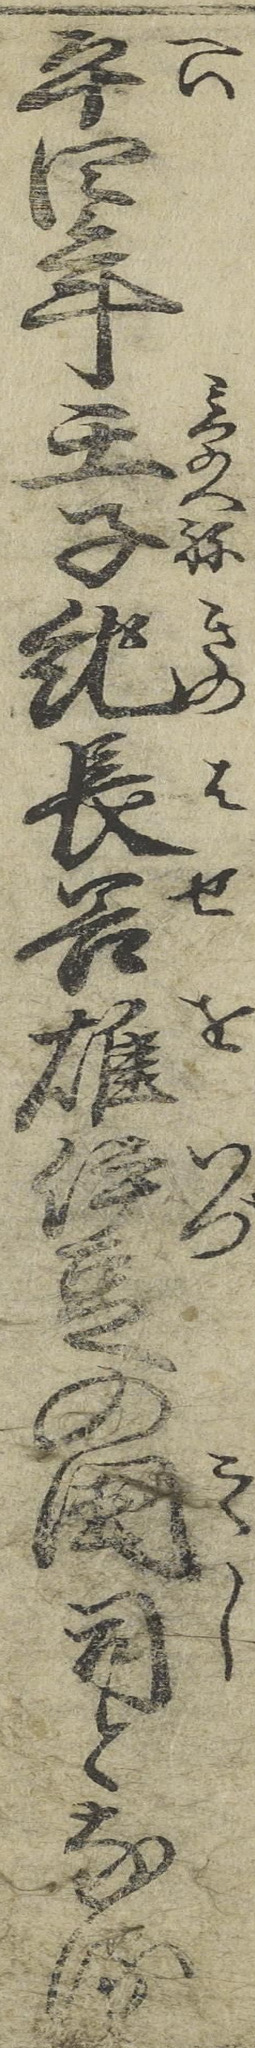平四年壬子紀長谷雄伊豆の国司となる

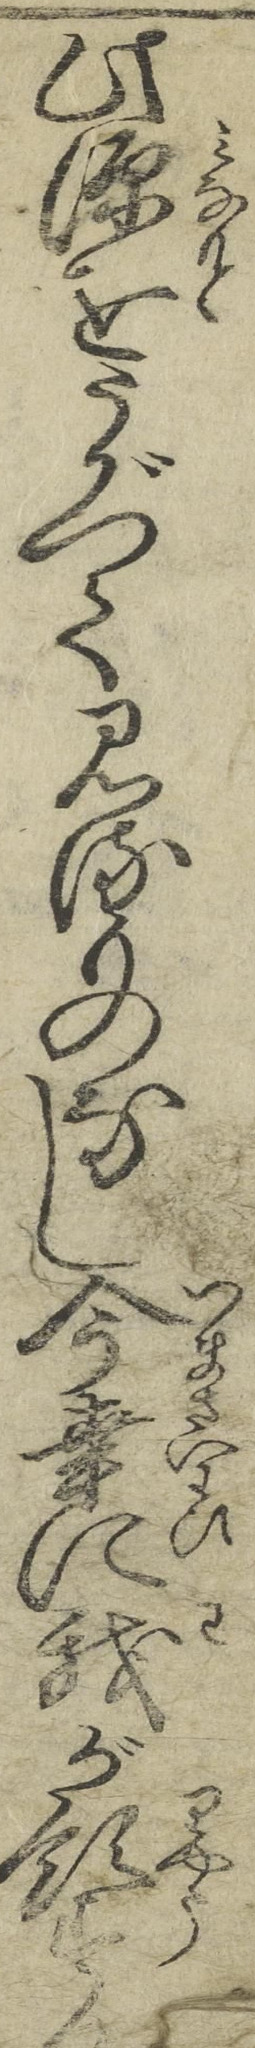此源をうがつて見るものなし今幸に我が領する
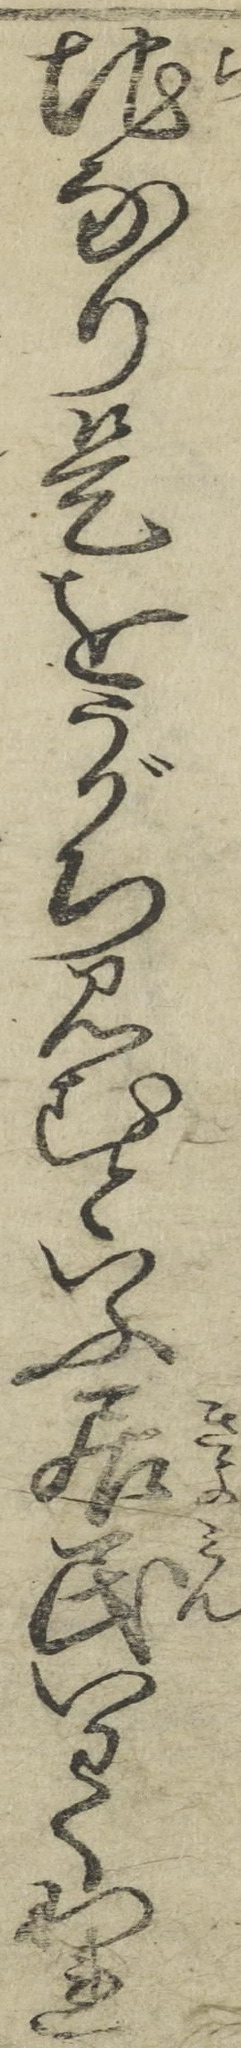地なり是をうがち見むといふ居民いわくわれ
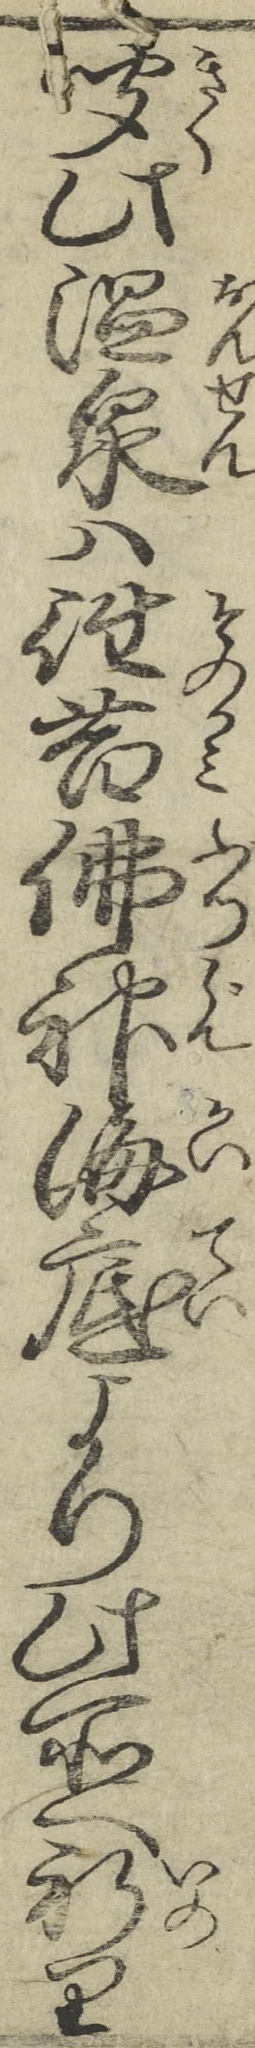聞此温泉は往昔仏神海底より此所へ祈り
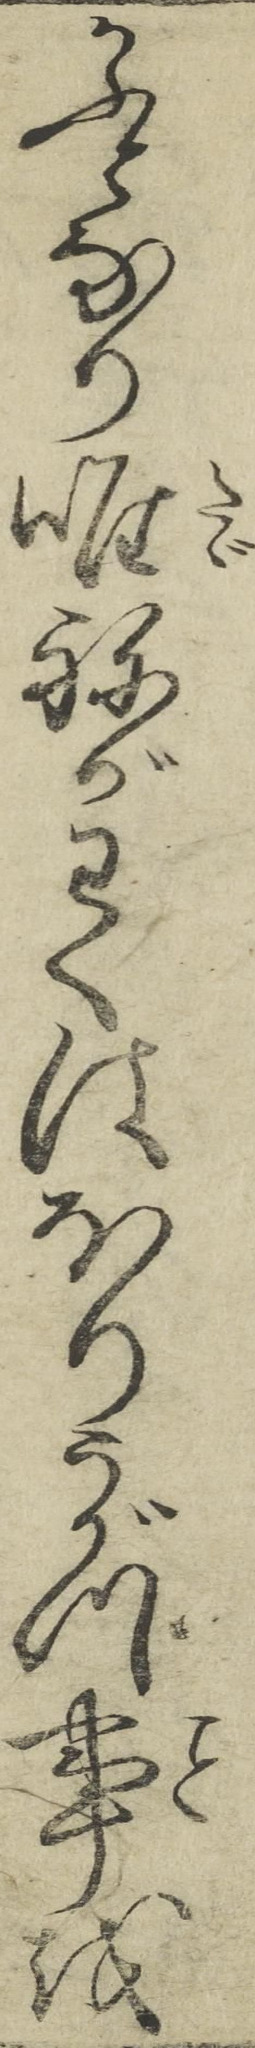かふとなり唯ねがわくはほりうがつ事を
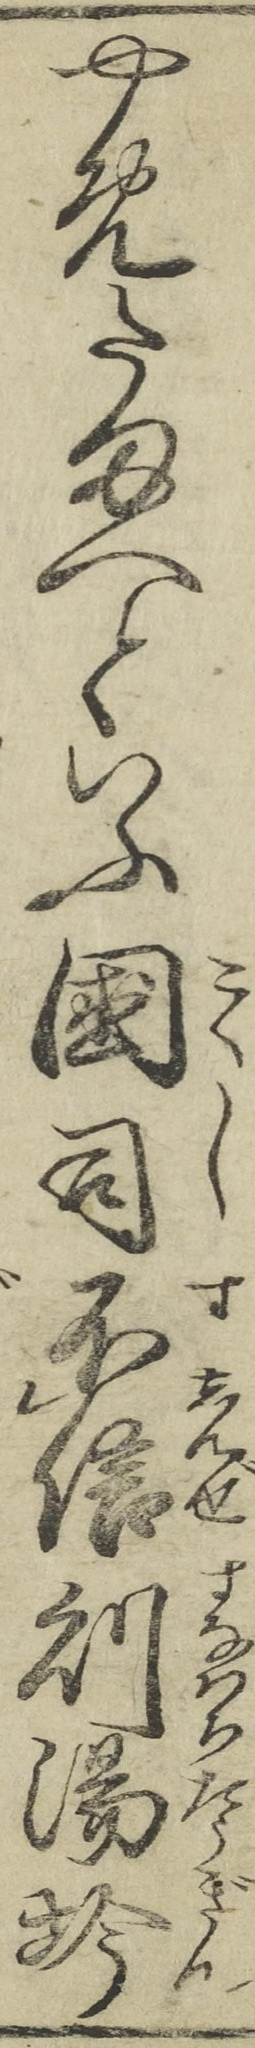やめたまへといふ国司不信則湯坅
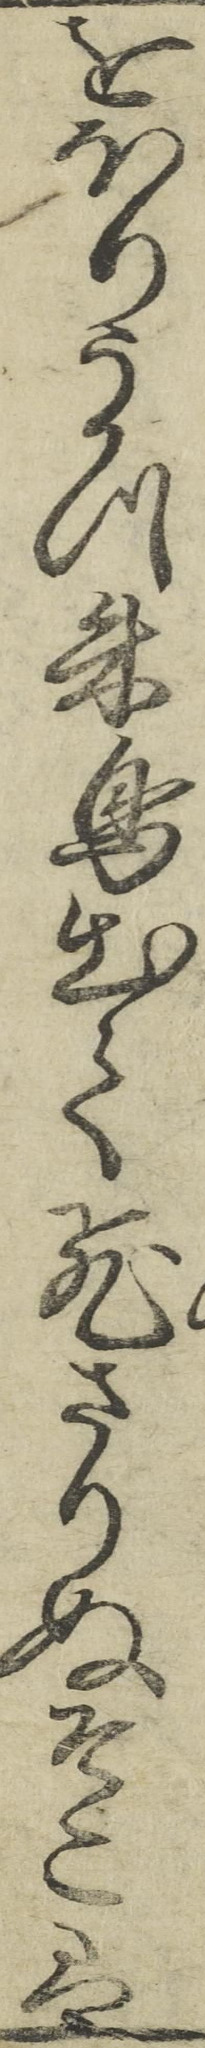をほりうかつ朱鳥出て飛さりぬそこは
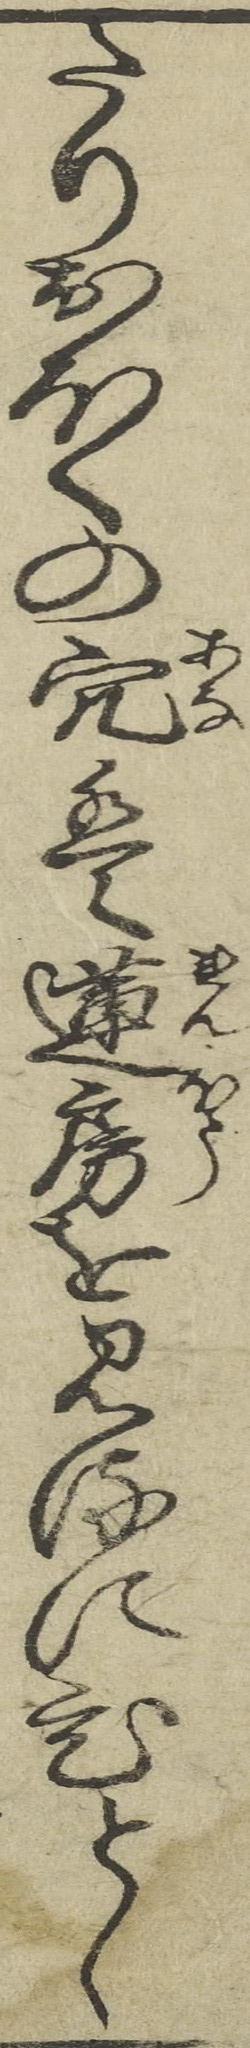たりおほくの穴は蓮房を見るにひとし
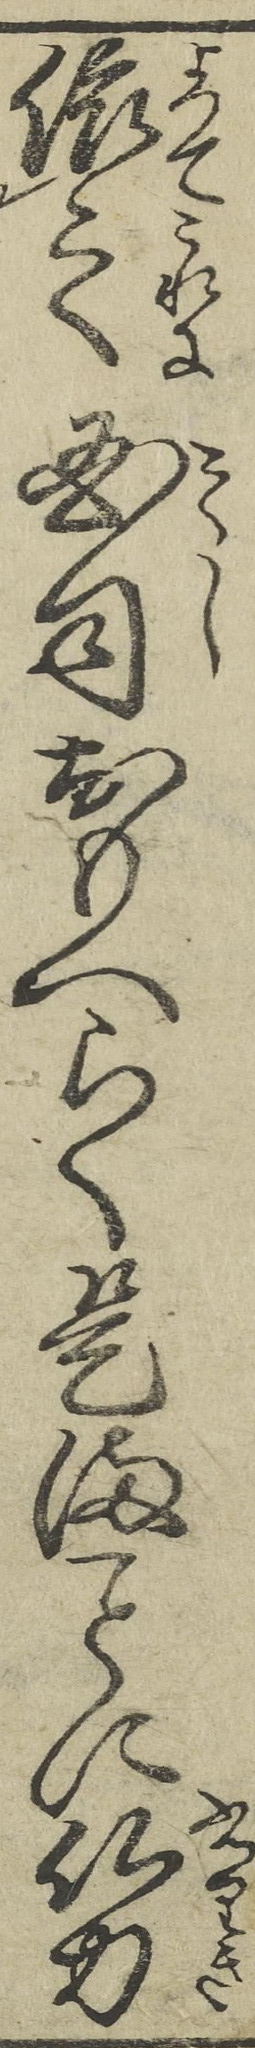依之国司おもへらく是まことに仏力
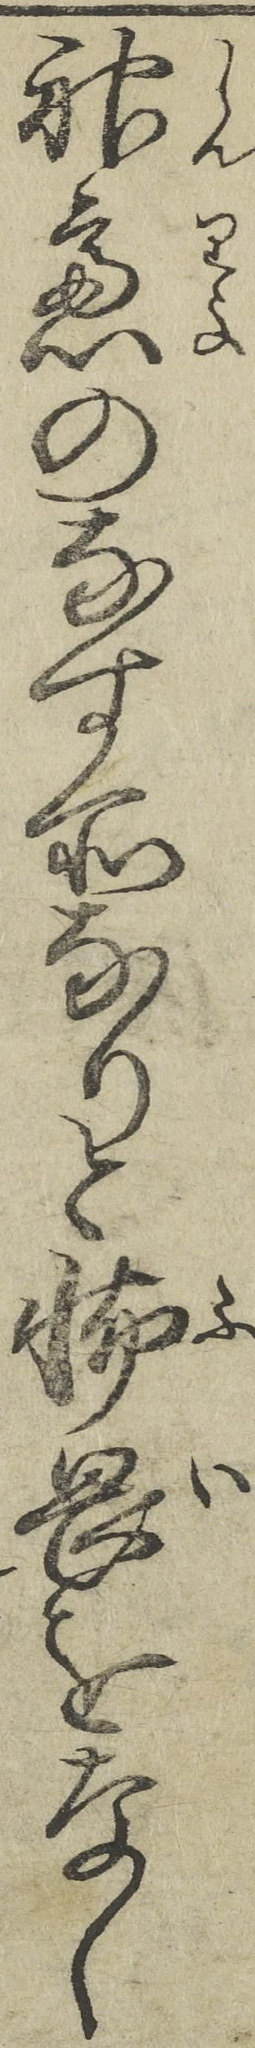神慮のなす所なりと怖畏をなし
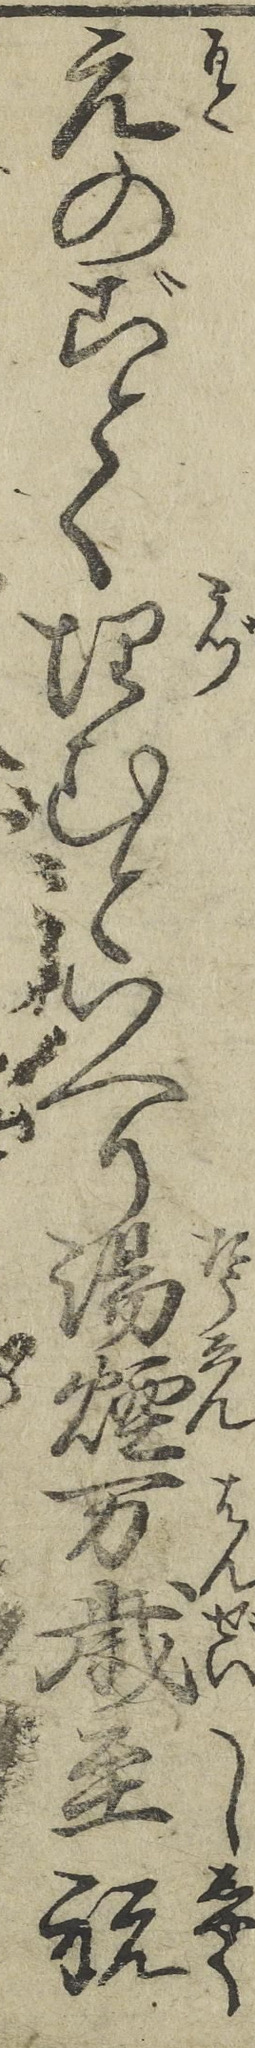元のごとく埋むといへり湯煙万歳至祝
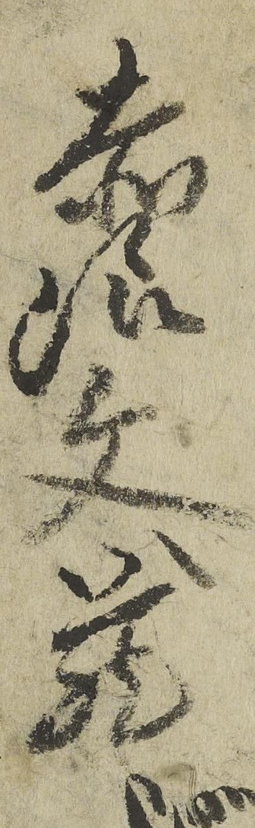赤沼文蔵

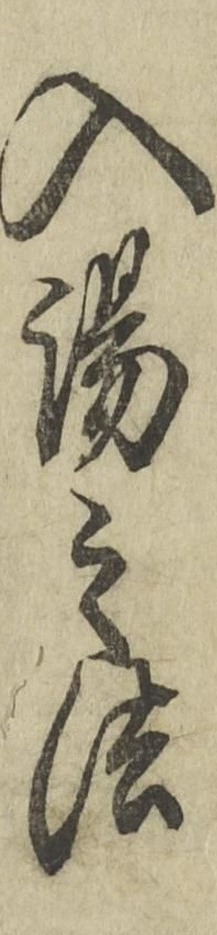入湯之法
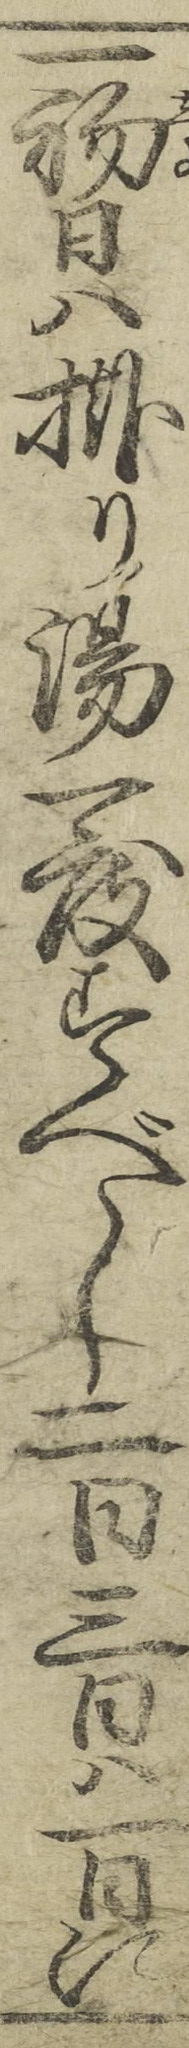一初日は掛り湯一度すべし二日三日は一日に
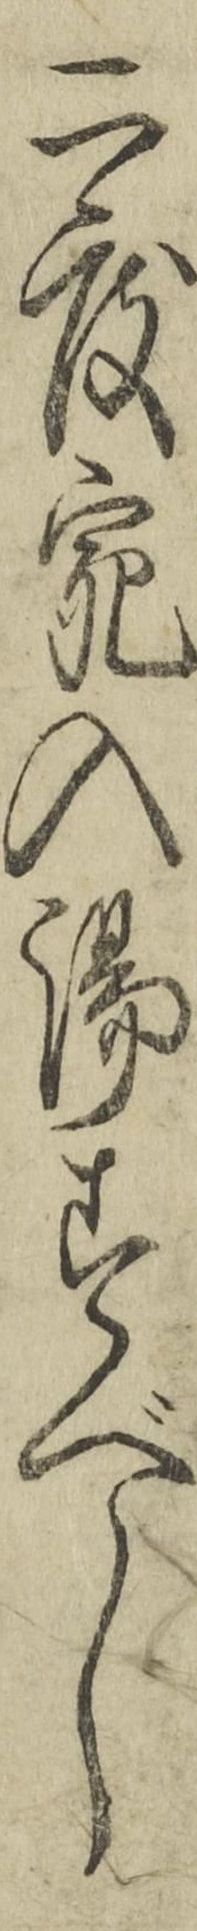二度宛入湯すべし
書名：伊豆國熱海温泉縁起
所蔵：東京大学地震研究所図書室 Earthquake Research Institute Library, The University of Tokyo, JAPAN
